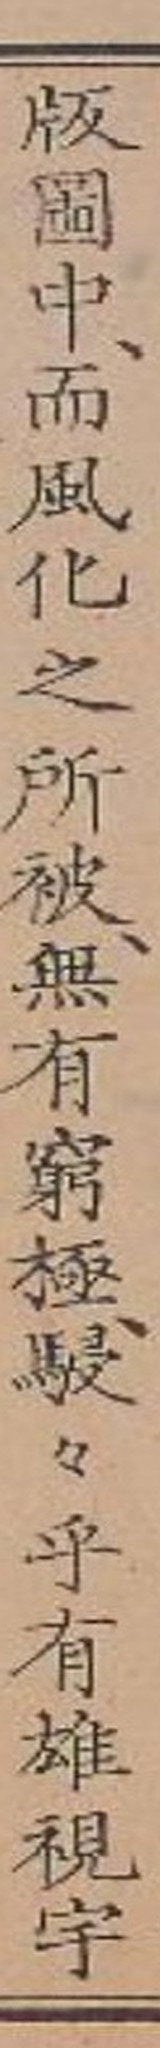版図中、而風化之所被、無有窮極、駸々乎有雄視宇
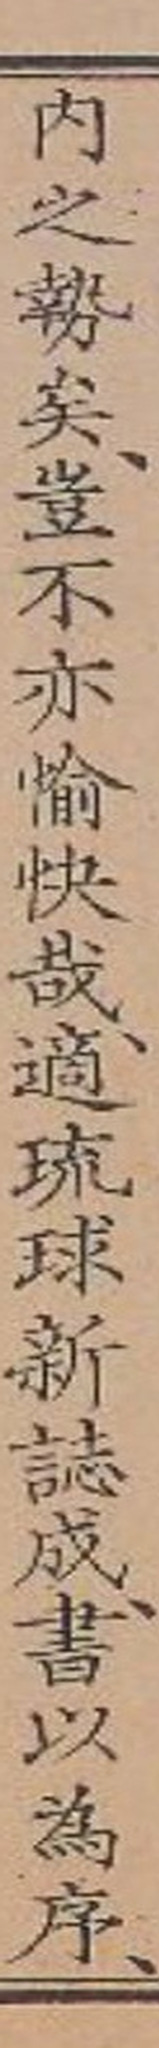内之勢矣、豈不亦愉快哉、適琉球新誌成、書以為序、
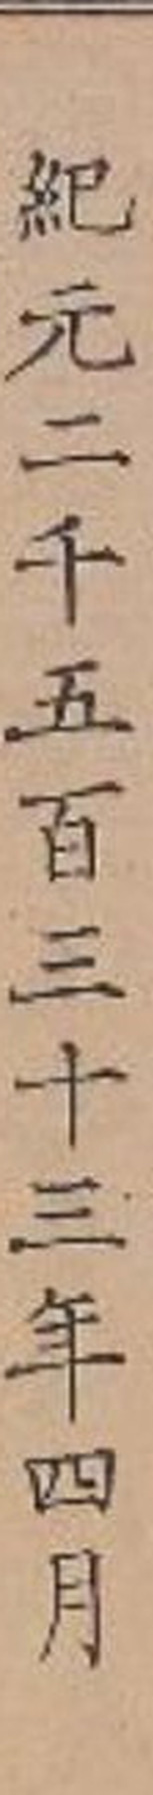紀元二千五百三十三年四月
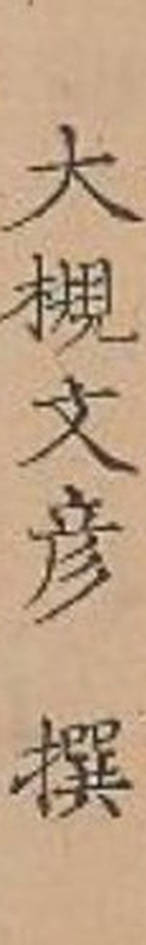大槻文彦撰
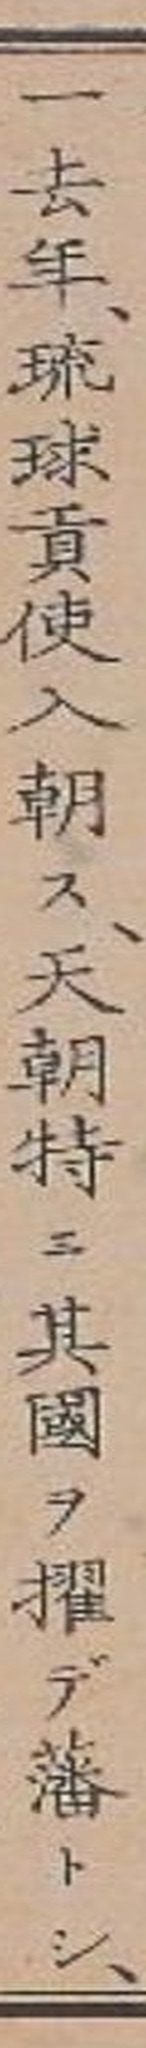一去年、琉球貢使入朝ス、天朝特ニ其国ヲ擢デ藩トシ、
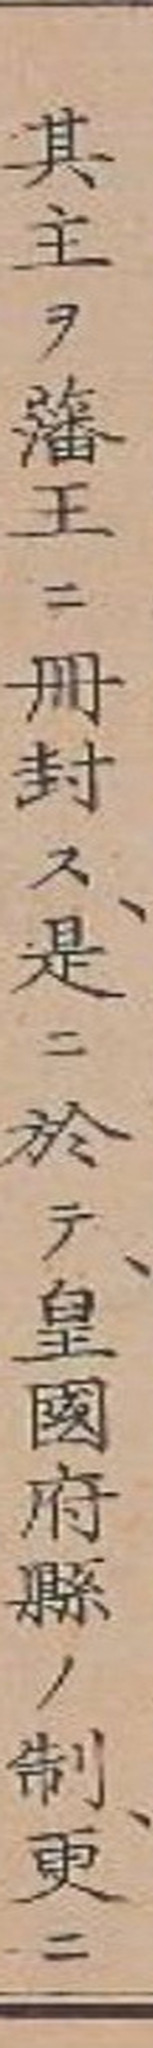其主ヲ藩王ニ冊封ス、是ニ於テ、皇国府県ノ制、更ニ
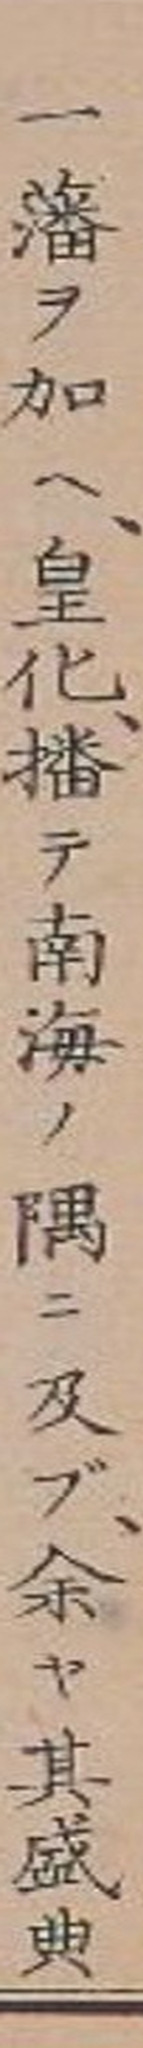一藩ヲ加ヘ、皇化、播テ南海ノ隅ニ及ブ、余ヤ其盛典
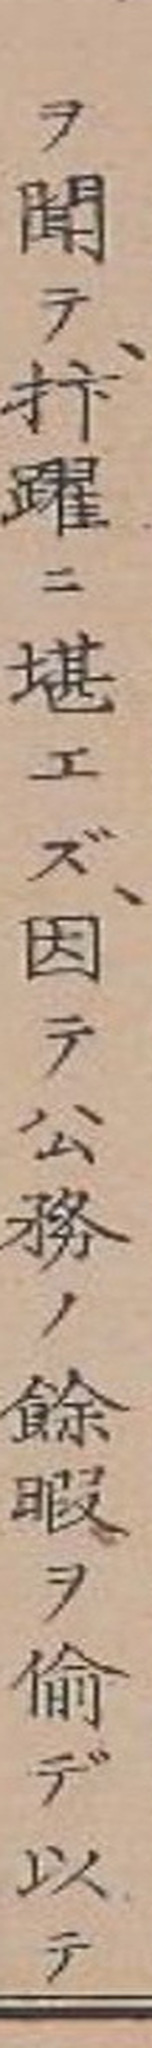ヲ聞テ、抃躍ニ堪エズ、因テ公務ノ余暇ヲ愉デ以テ
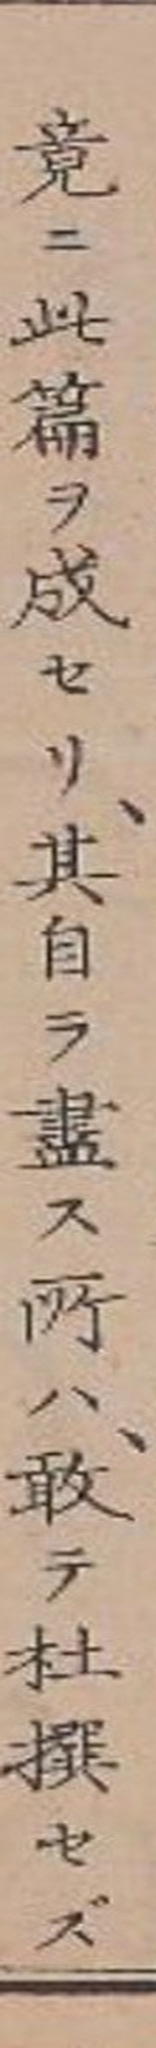竟ニ此篇ヲ成セリ、其自ラ尽ス所ハ、敢テ杜撰セズ
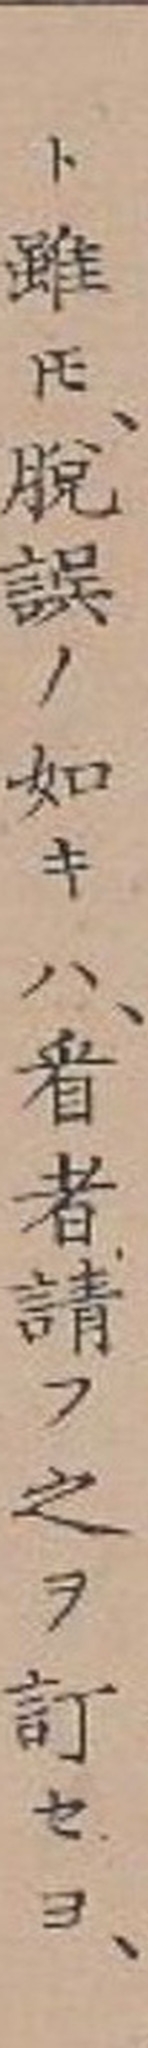ト雖トモ、脱誤ノ如キハ、看者請フ之ヲ訂セヨ、
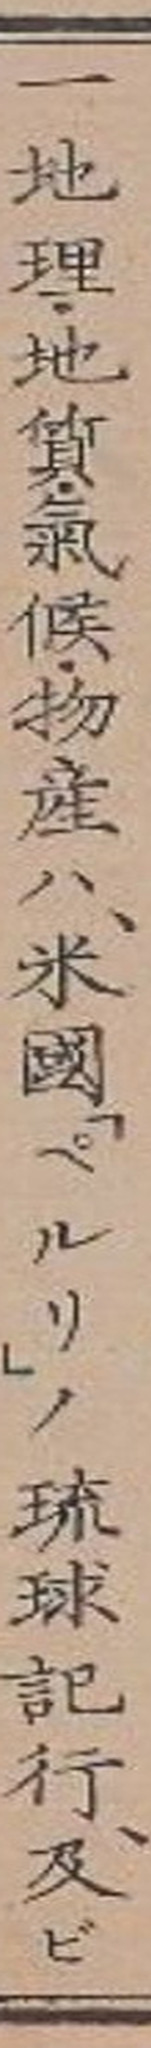一地理・地質・気候・物産ハ、米国「ペルリ」ノ琉球記行、及ビ
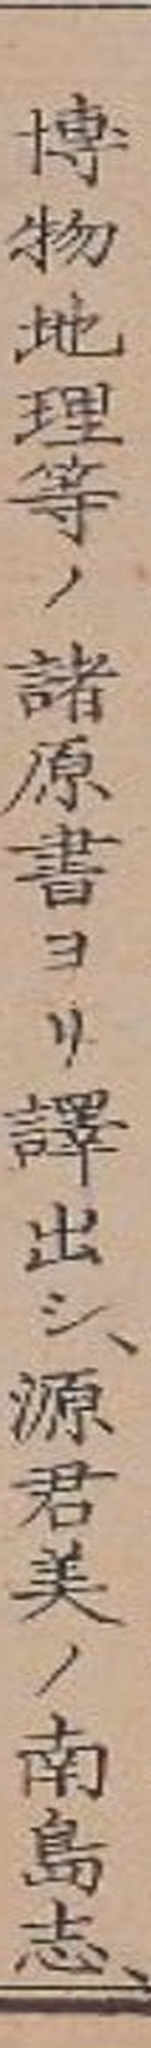博物地理等ノ諸原書ヨリ訳出シ、源君美ノ南島志、
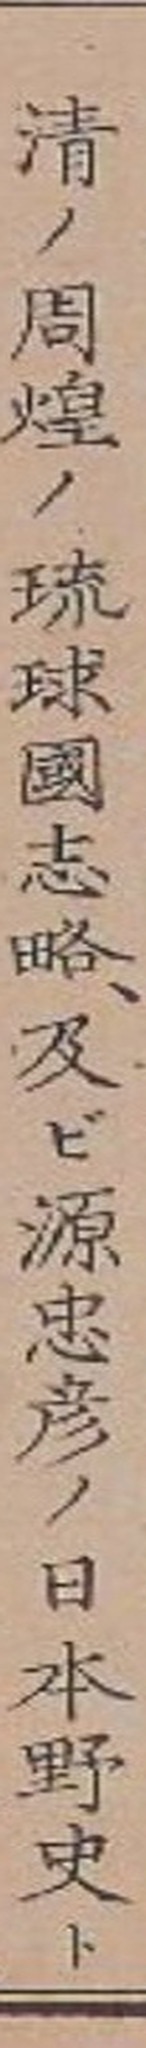清ノ周煌ノ琉球国志略、及ビ源忠彦ノ日本野史ト
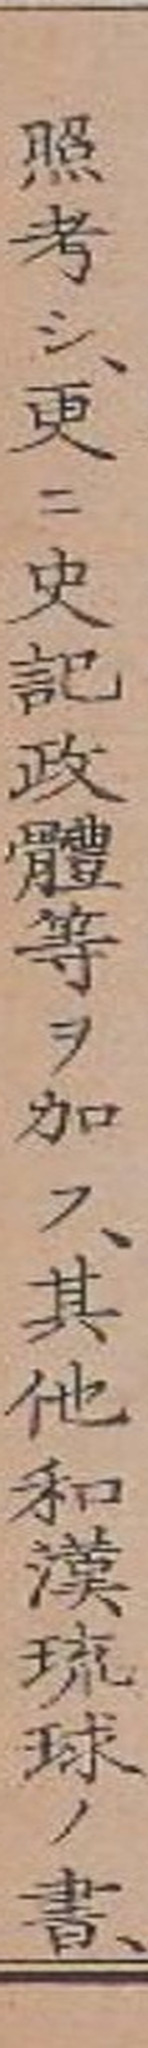照考シ、更ニ史記政体等ヲ加フ、其他和漢琉球ノ書、

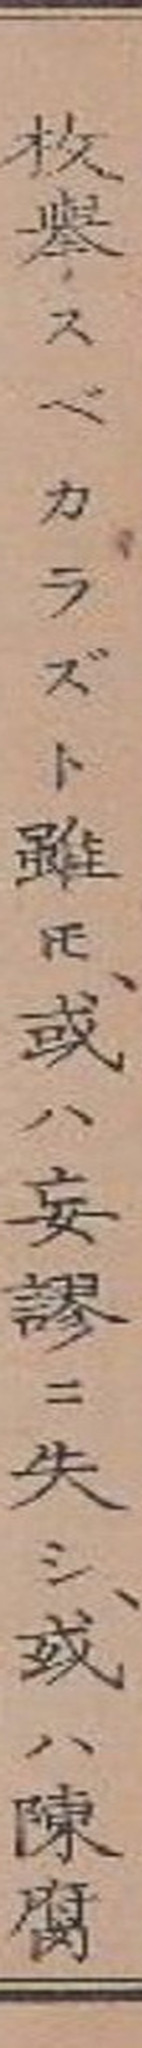枚挙スベカラズト雖トモ、或ハ妄謬二失シ、或ハ陳腐
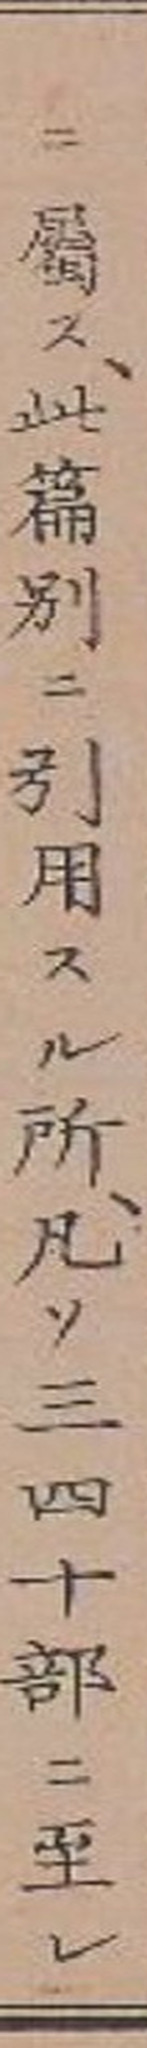ニ属ス、此篇別ニ引用スル所、凡ソ三四十部ニ至レ
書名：琉球新誌 巻上
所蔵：University of the Ryukyus Library
